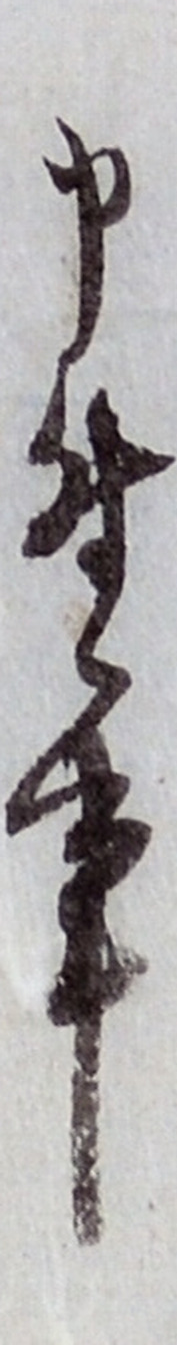申付候事
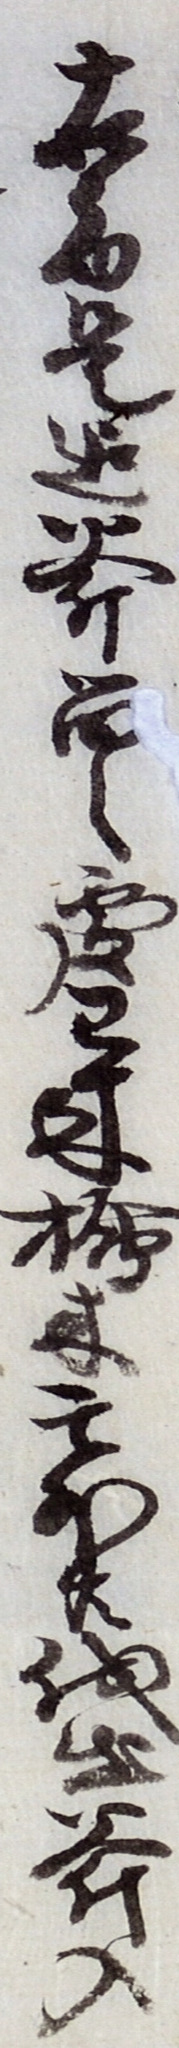右之者是迄斧留之処已来桧木其外共伐出斧入
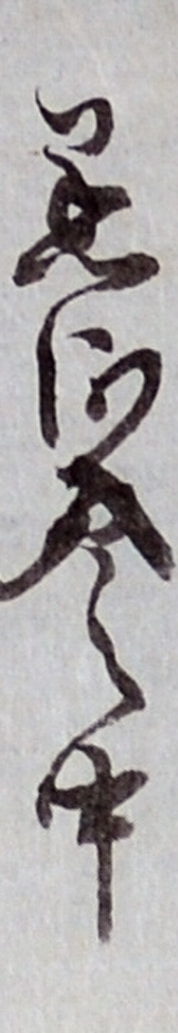黒河入之中
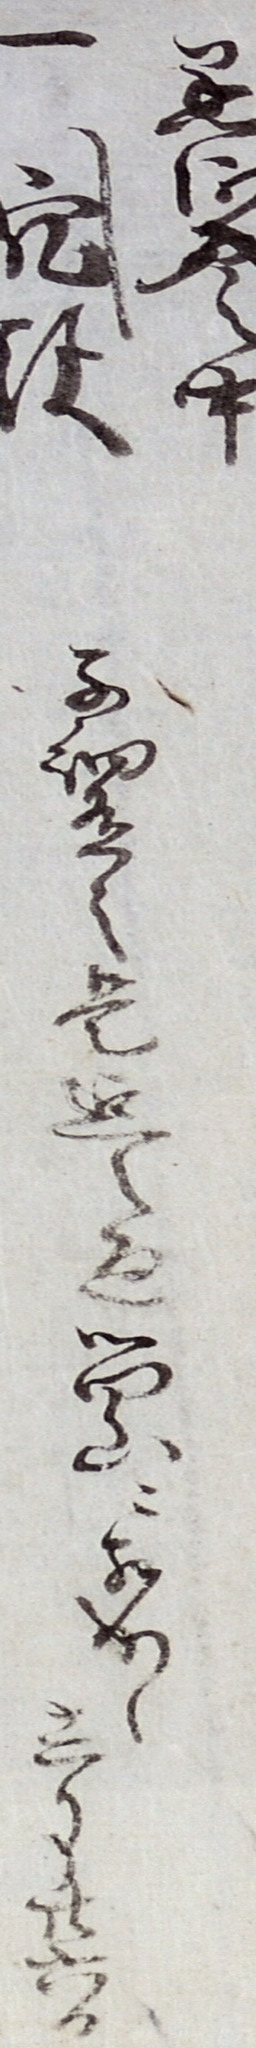一穴沢子細有之是迄之通留山ニ相成候十二月廿六日
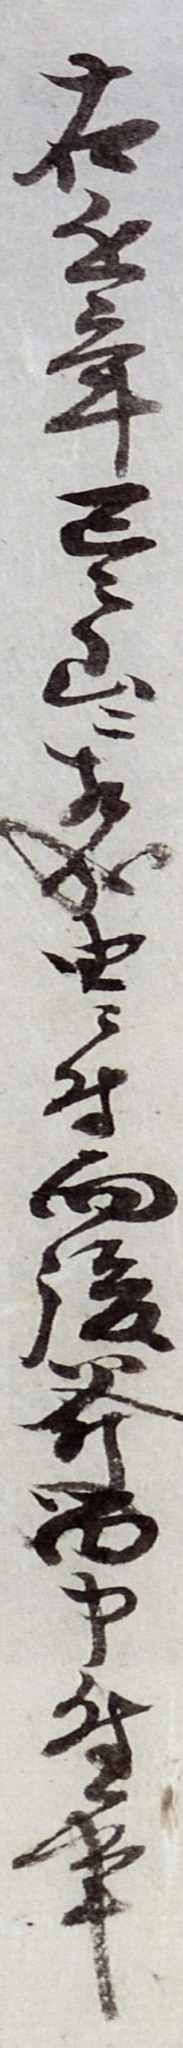右近年尽山ニ相成由ニ付向後斧留申付候事
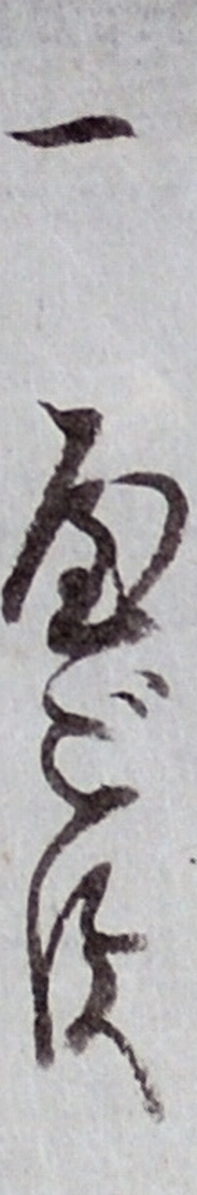一やご沢
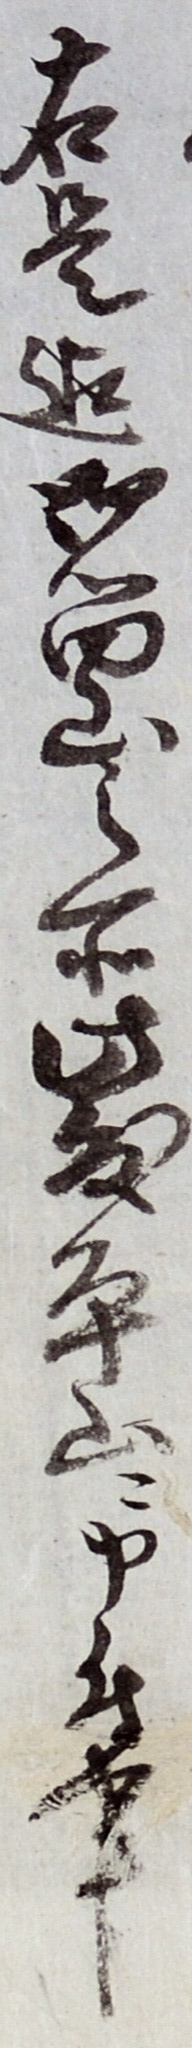右是迄御留山之所此度平山ニ申付事
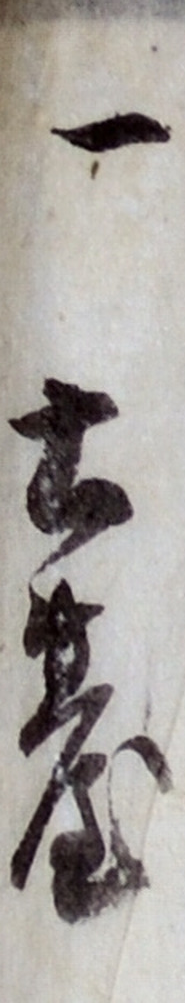一土台
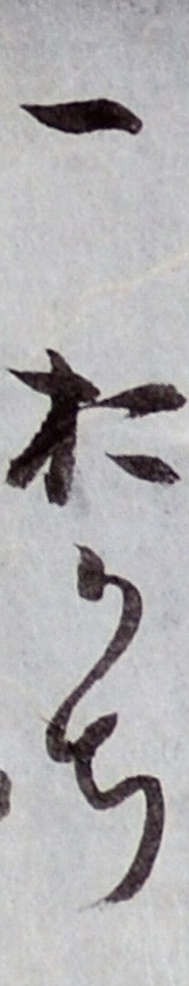一於かち
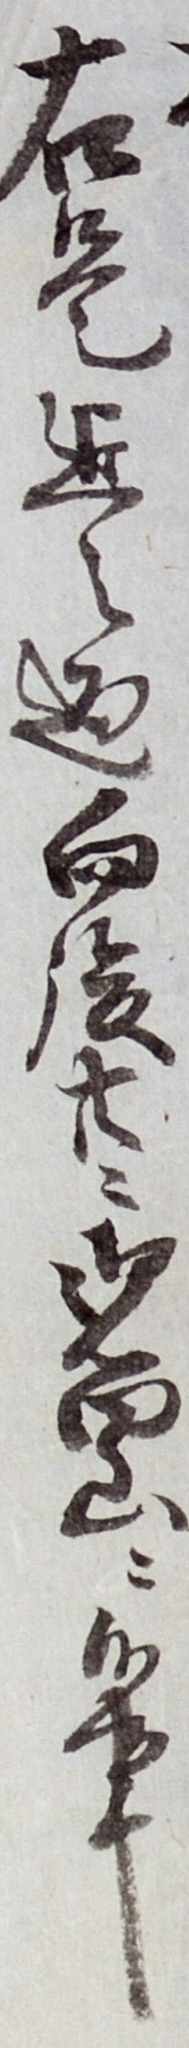右是迄之通向後共ニ御留山ニ候事

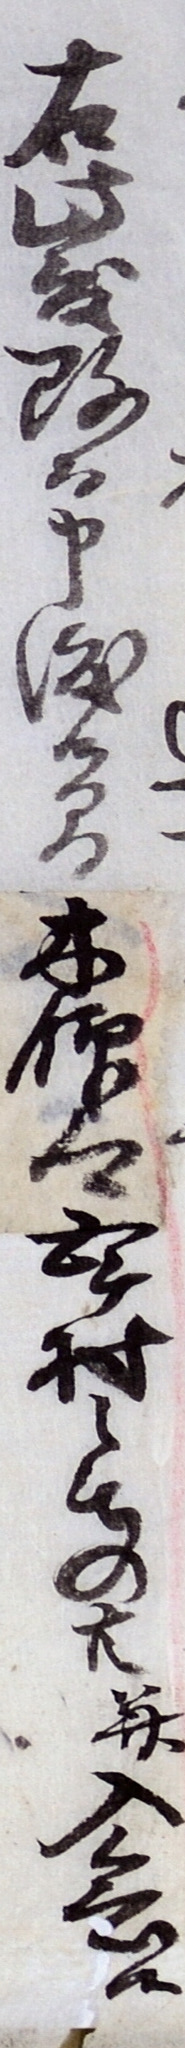右此度改而申渡候間木師郷五ヶ村之もの共并入念候
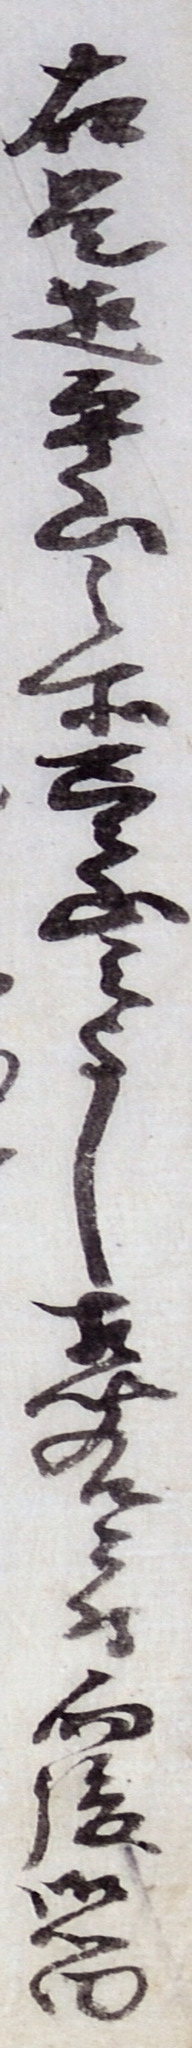右是迄平山之所尽山之よし相聞候ニ付向後御留
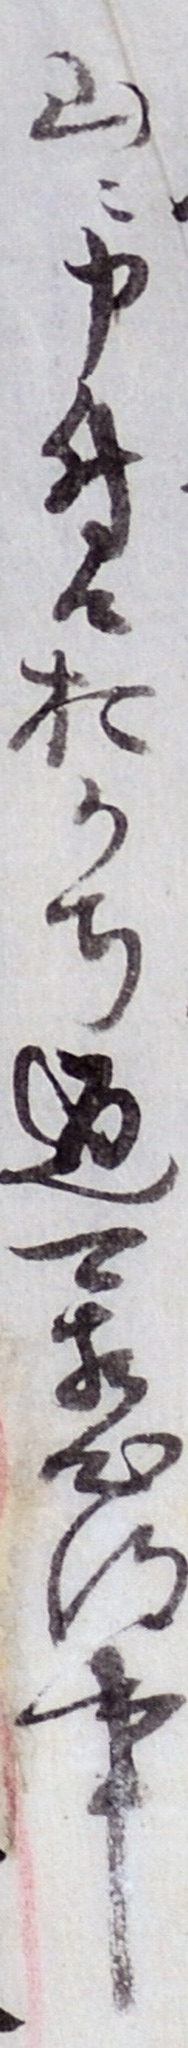山ニ申付候於かち通可相心得事
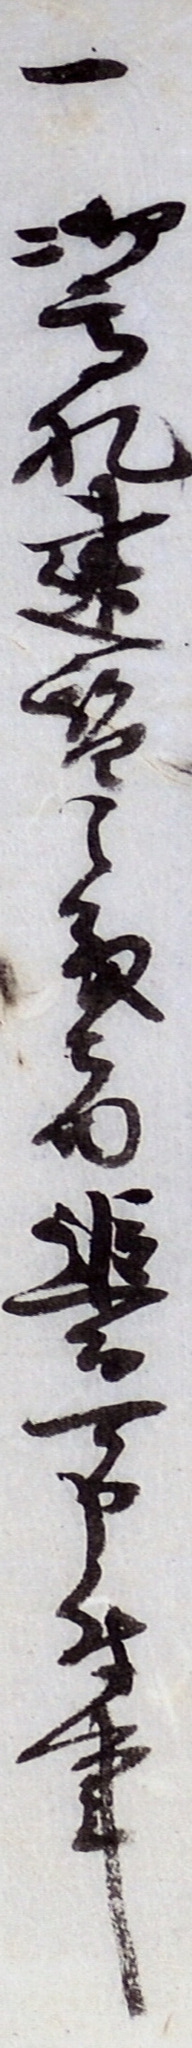一御高札建替之義者追而可申付事
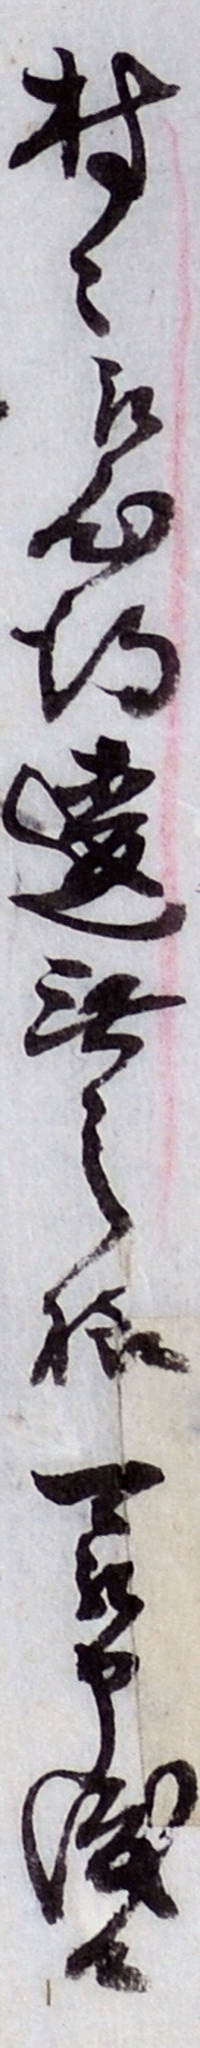村々江心得違無之様可被申渡候
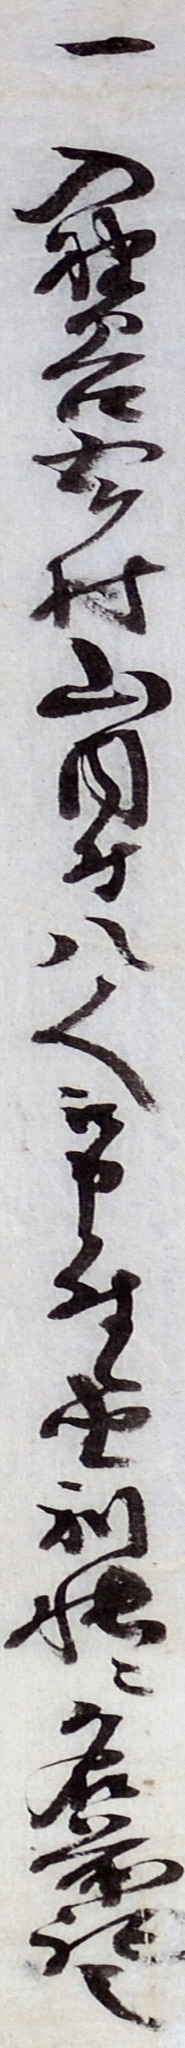一入野谷五ヶ村山目付八人被申付候由別帳ニ名前記申候
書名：御山奉行御用留
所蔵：伊那市立高遠町図書館・合同会社AMANE
